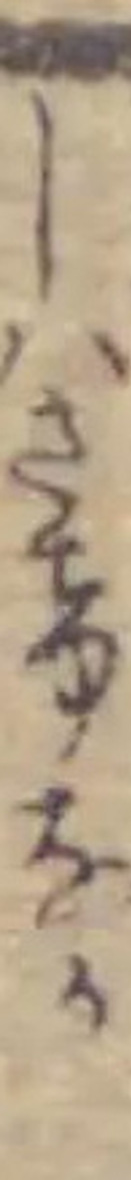しはさけなか
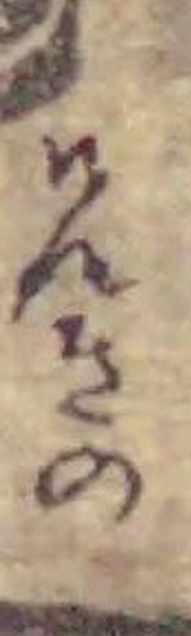けんきの
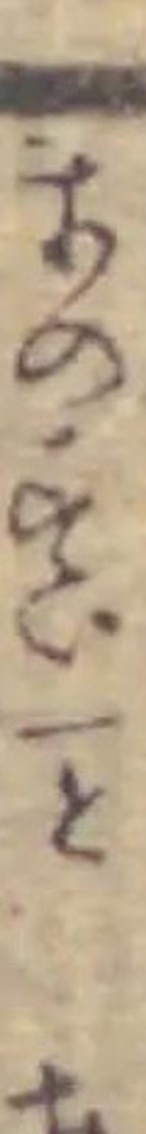まのすい一と
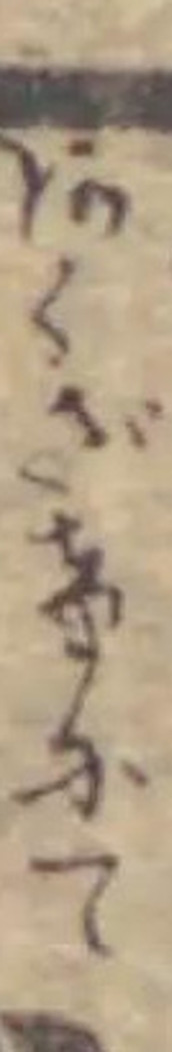あくざけにて
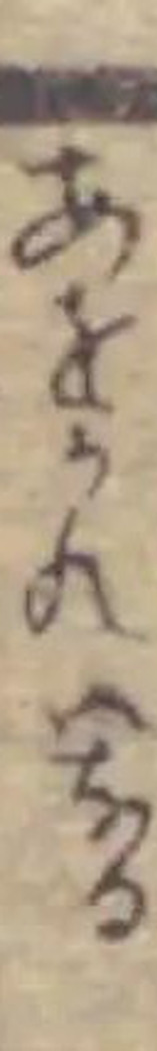あをかれいなる
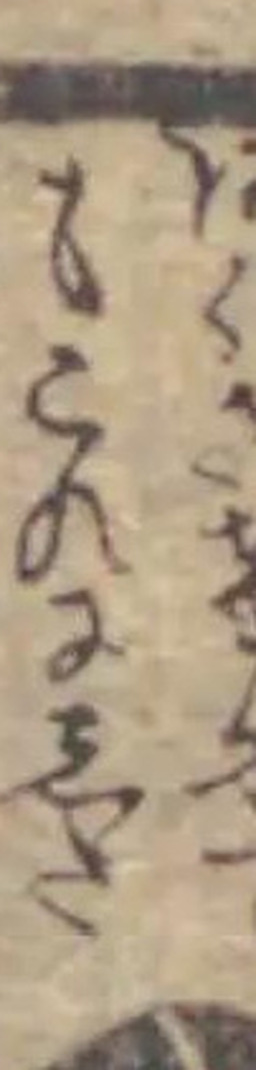もこれにした
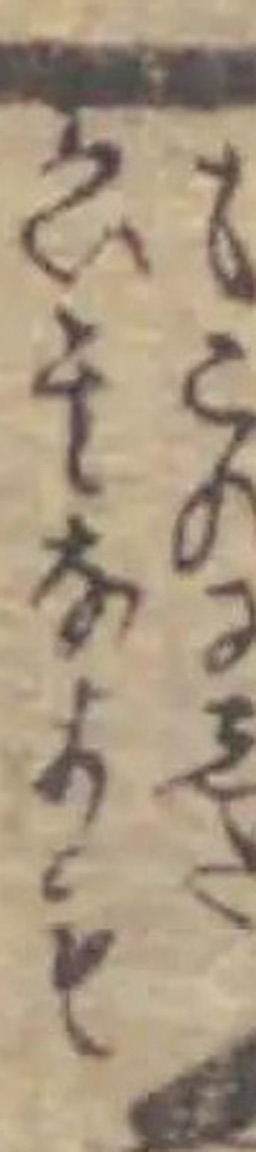かい其なにも
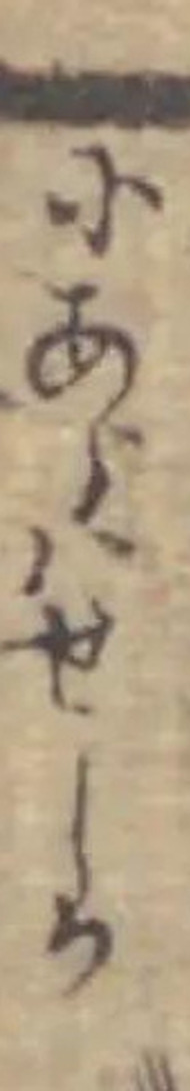小あらはせしか
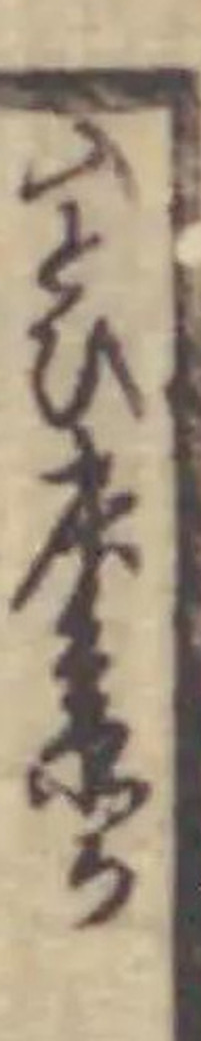入とひ庄兵衛か
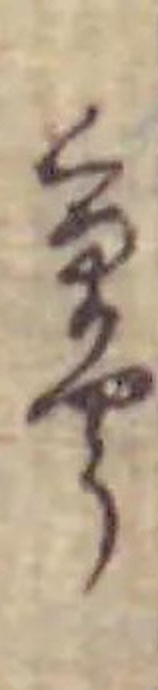くりやう
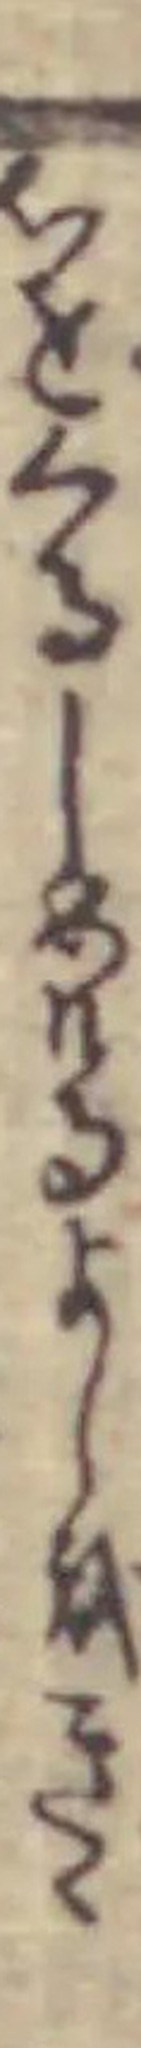心をくるしめけるよしをきゝ
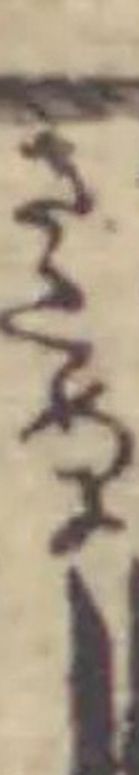さために
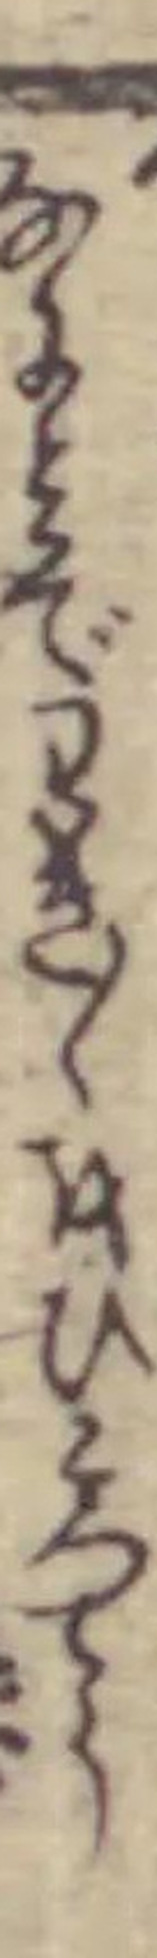なにとぞわれ〳〵をひとつてう
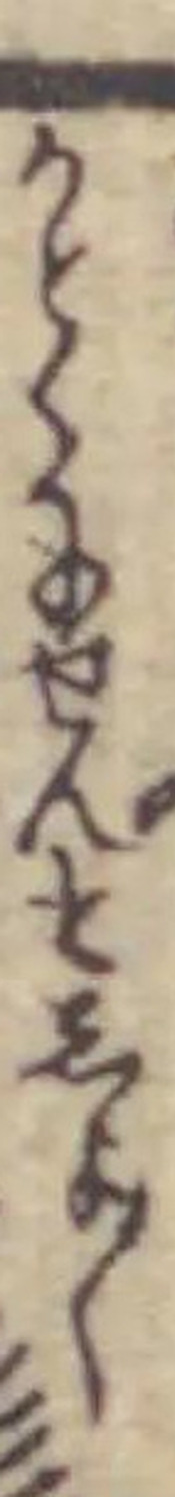かとくにせんとしよ〳〵
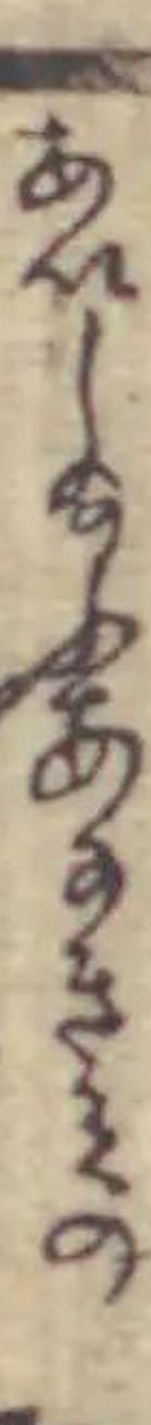あいし給ふあにきみの
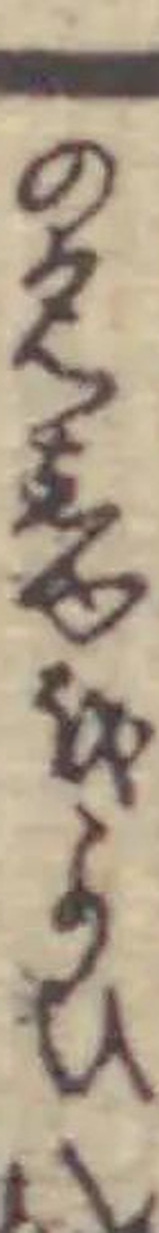のししやをよひ
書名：餅酒腹中能同志 2巻
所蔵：国立国会図書館 National Diet Library, JAPAN
